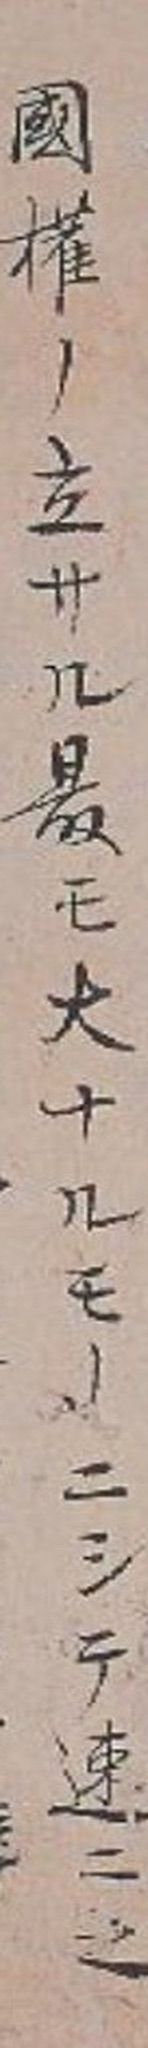国権ノ立サル最モ大ナルモノニシテ速ニ之
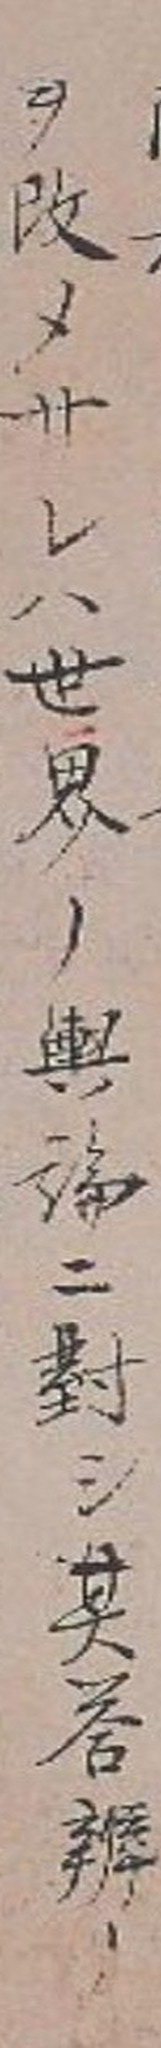ヲ改メサレハ世界ノ輿論ニ対シ其答弁ノ
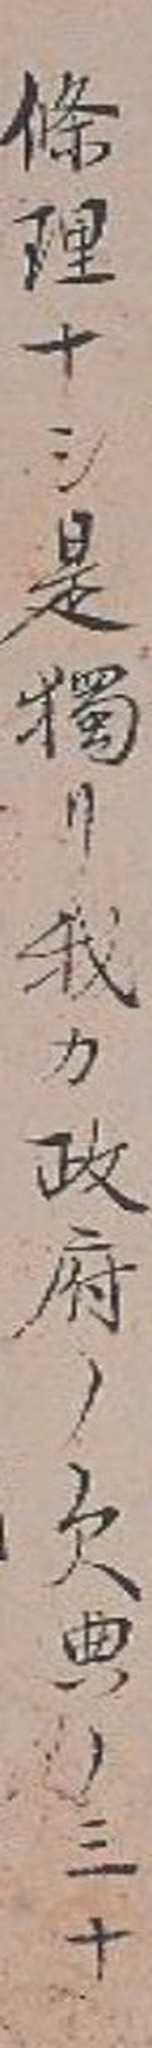条理ナシ是独リ我カ政府ノ欠典ノミナ
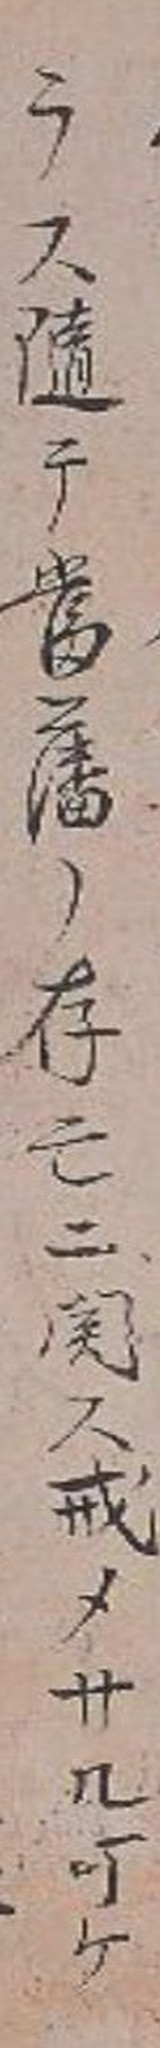ラス随テ当藩ノ存亡ニ関ス戒メサル可ケ
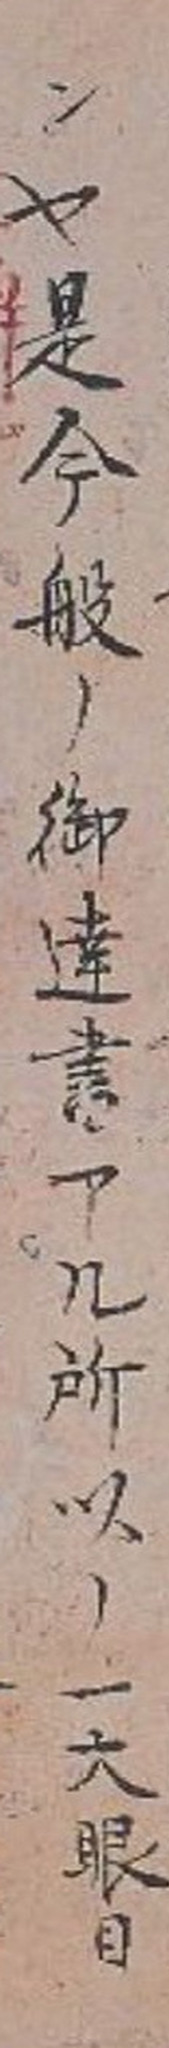ンヤ是今般ノ御達書アル所以ノ一大眼目
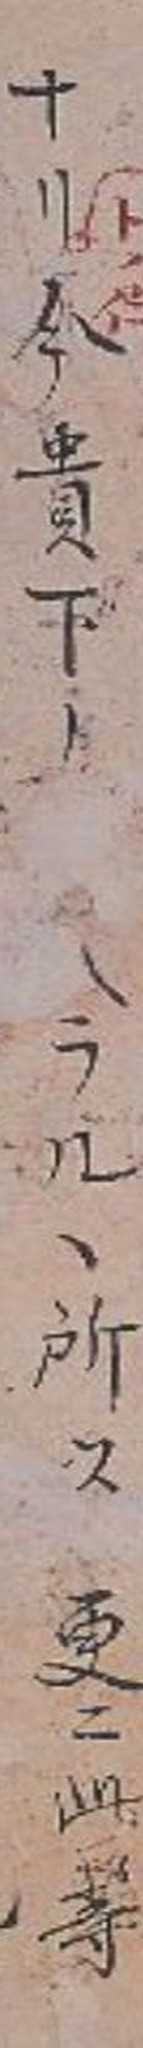ナリ今貴下ノラルヽ所ス更ニ此等

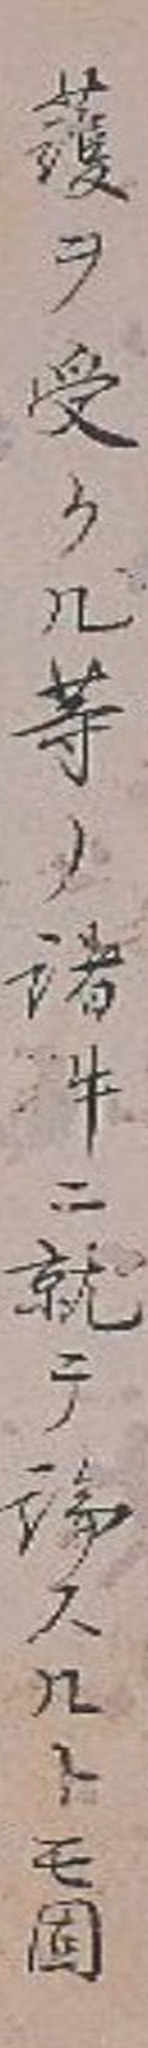護ヲ受クル等ノ諸件ニ就テ論スルトモ固
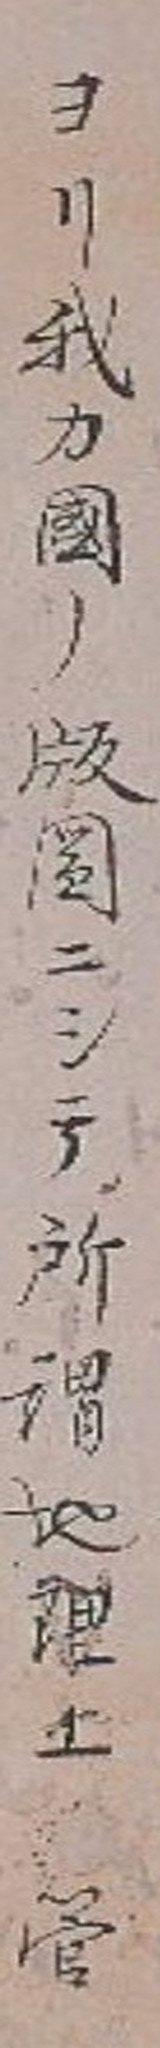ヨリ我カ国ノ版図ニシテ所謂地理官
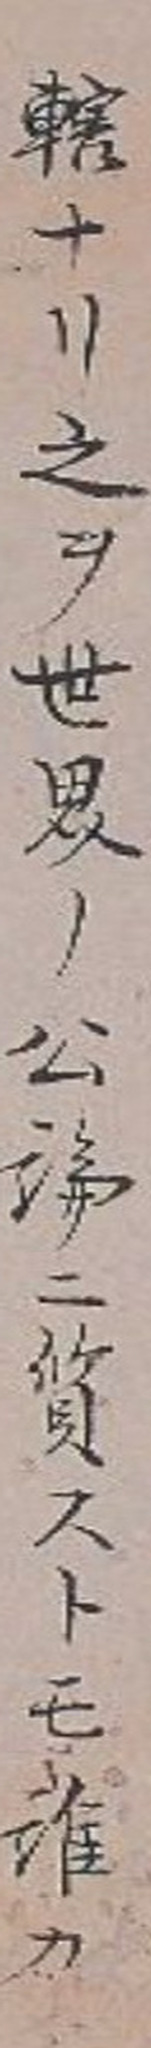轄ナリ之ヲ世界ノ公論ニ質ストモ誰カ
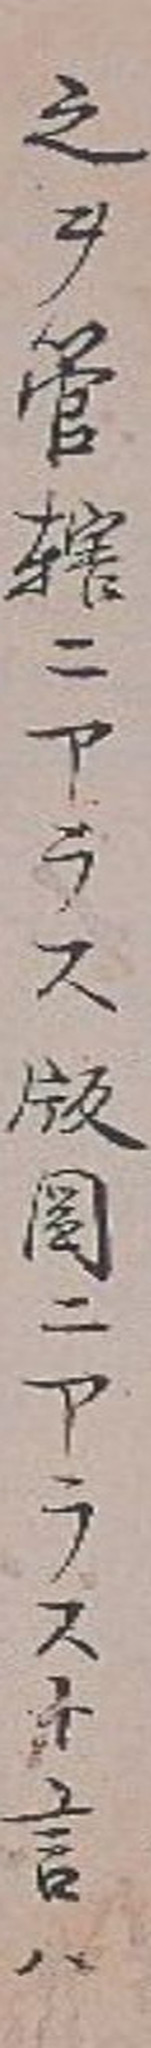之ヲ管轄ニアラス版図ニアラスト言ハ
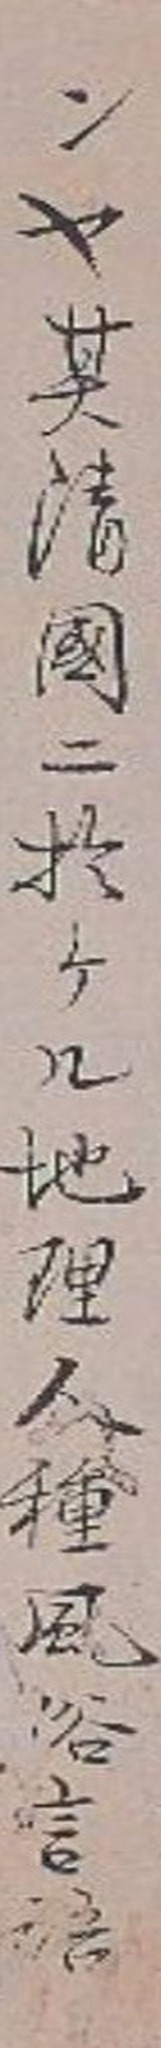ンヤ其清国ニ於ケル地理人種風俗言語
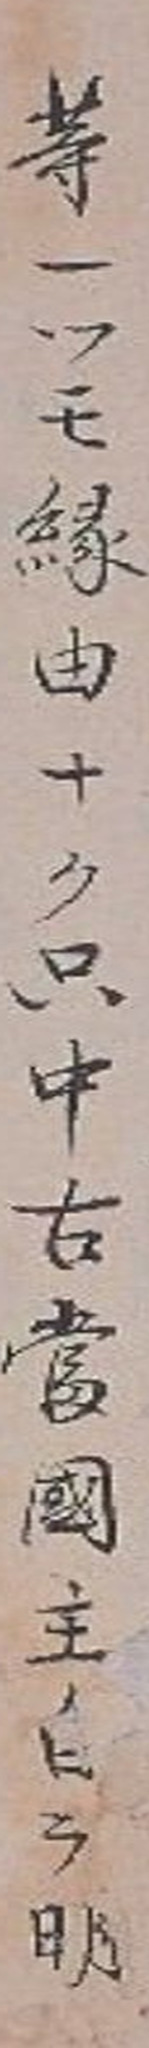等一ツモ縁由ナク只中古当国主自ラ明
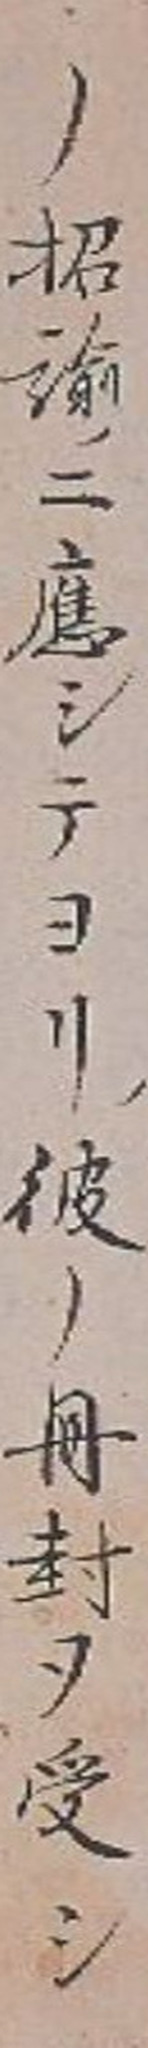ノ招諭ニ応シテヨリ、彼ノ冊封ヲ受シ
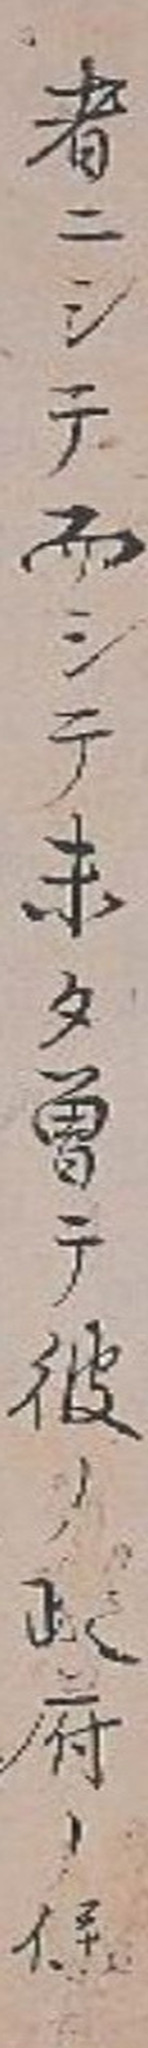者ニシテ而シテ未タ曽テ彼ノ政府ノ保
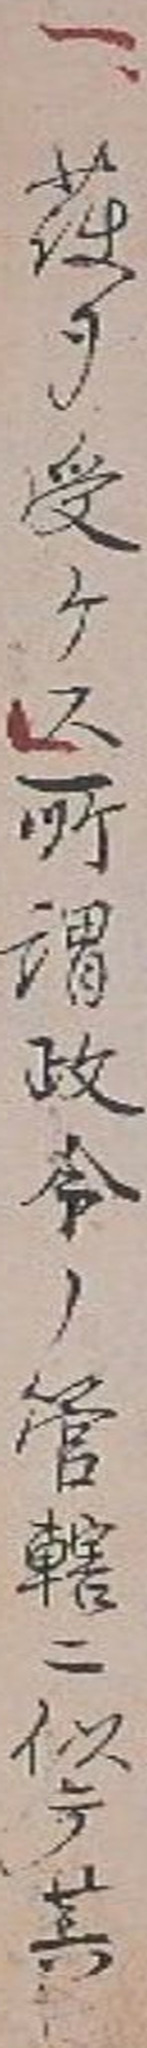一、ヲ受ケス」所謂政令ノ管轄ニ似テ其
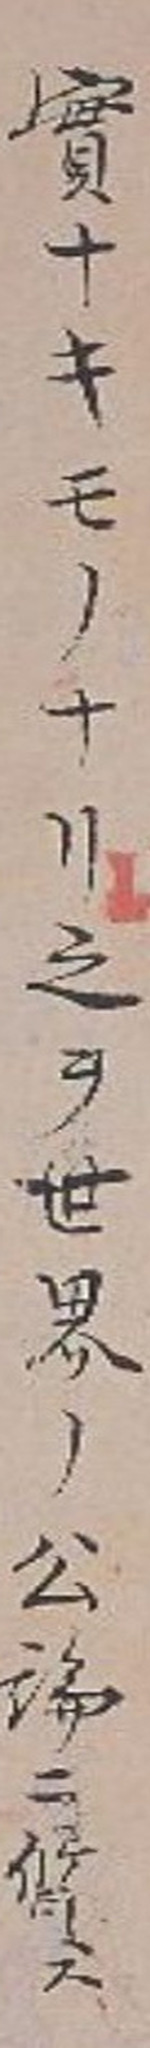実ナキモノナリ之ヲ世界ノ公論ニ質ス
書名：奉使琉球始末 草稿之一部
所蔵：University of the Ryukyus Library
